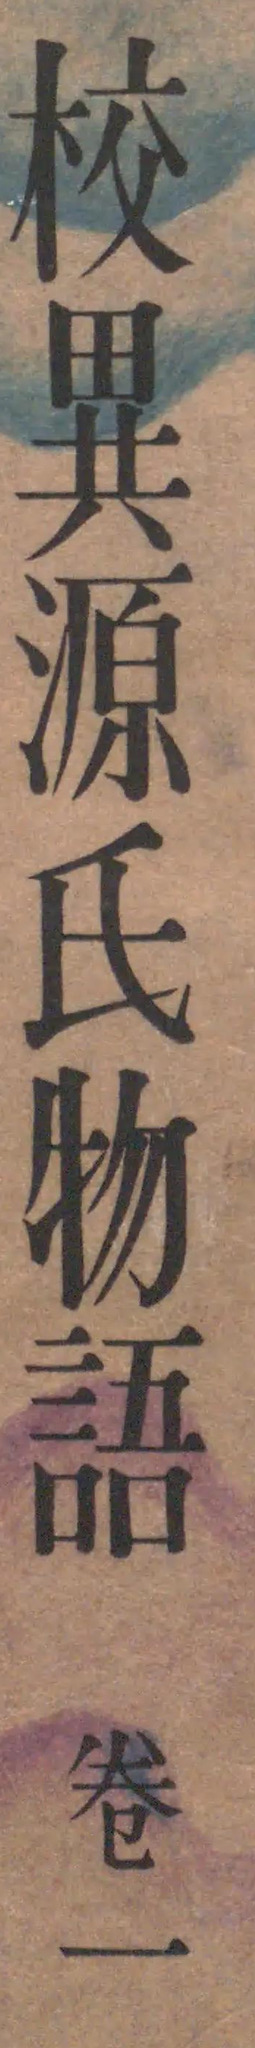校異源氏物語巻一

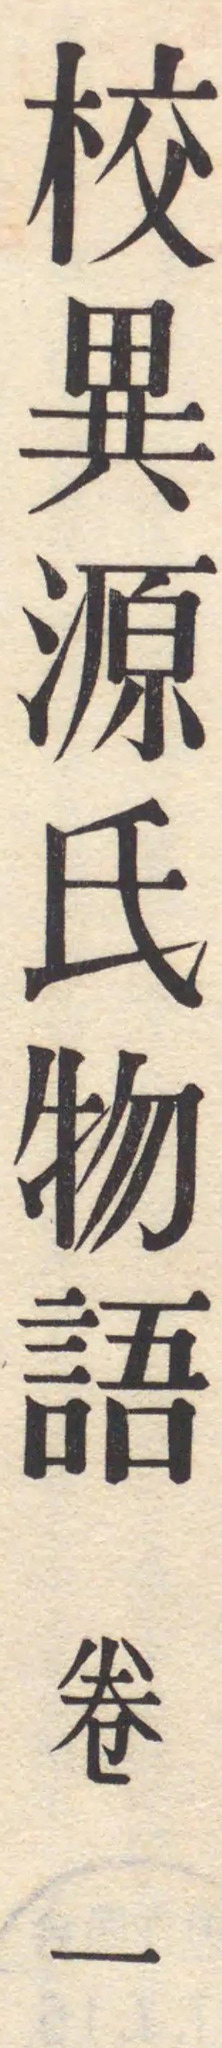校異源氏物語卷一

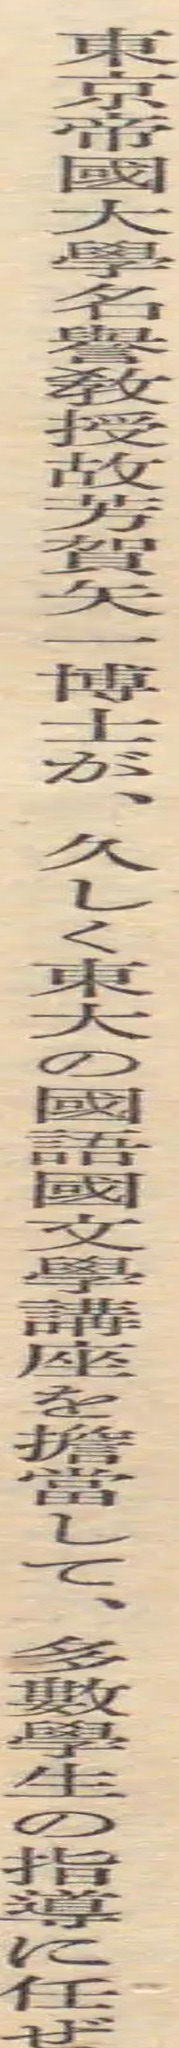東京帝國大學名譽敎授故芳賀矢一博士が、久しく東大の國語國文學講座を擔當して、多數學生の指導に任ぜ
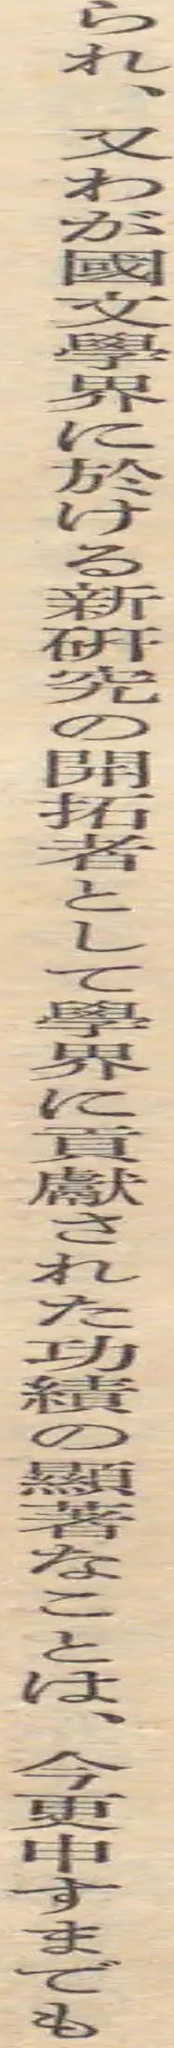られ、脵わが國文學界に於ける新硏究の開拓者として學界に貢獻された功績の顯著なことは、今更申すまでも
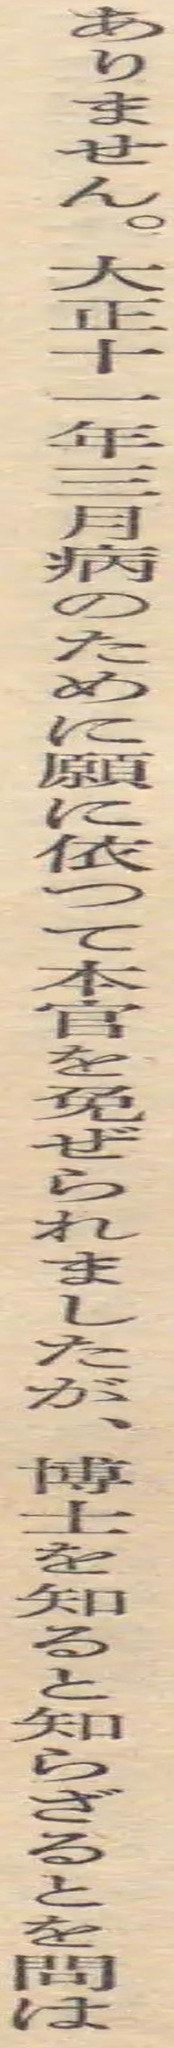ありません。大正十一年三月病のために願に依って本官を免ぜられましたが、博士を知ると知らざるとは問は
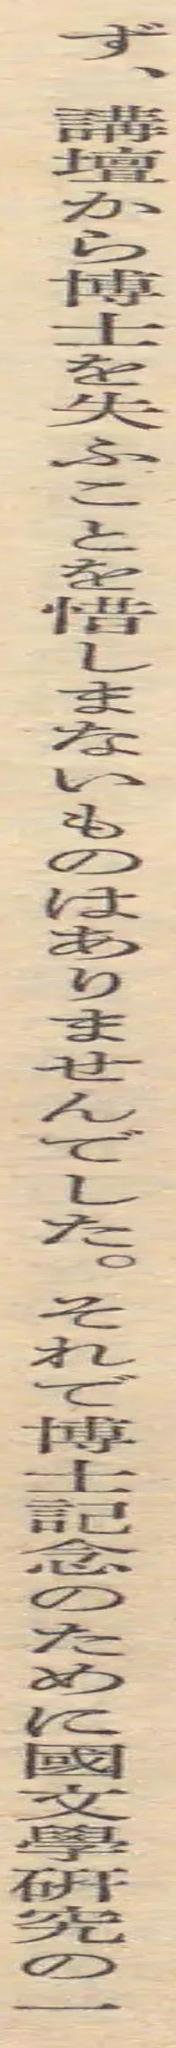ず、講壇から博士を失ふことを惜しまないものはありませんでした。それで博士記念のために國文學硏究の一
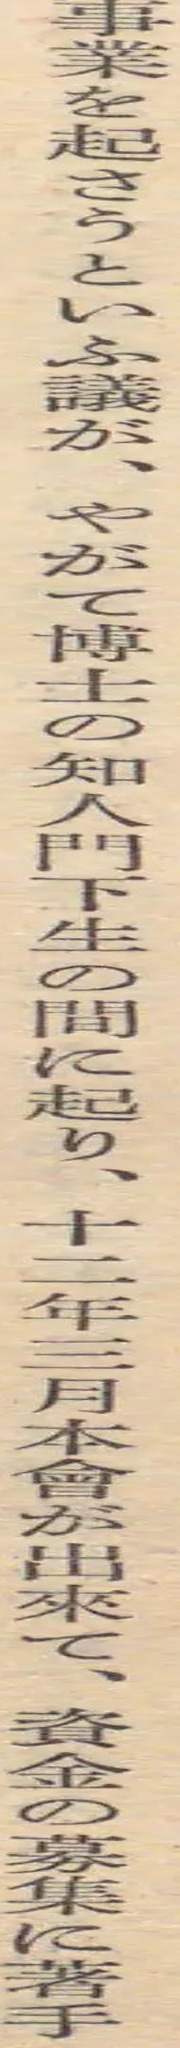事業を起さうといふ議が、やがて博士の知人門下生の間に起り、十二年三月本會が出來て、資金の募集に著手
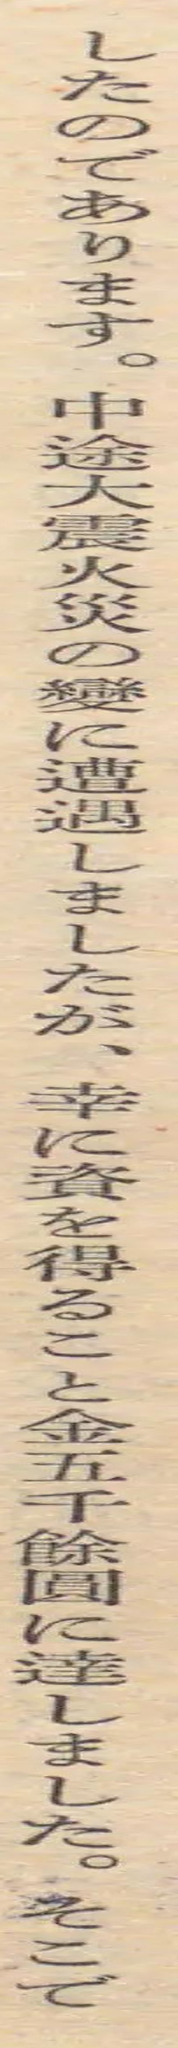したのであります。中途大震火災の變に遭遇しましたが、幸に資を得ること金五千餘圓に達しました。そこで
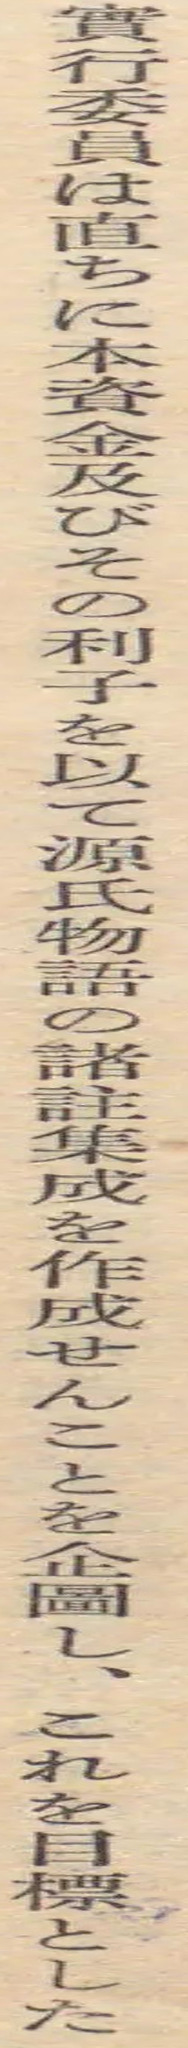實行委員は直ちに本資金及びその利子以て源氏物語の諸註集成を作成せんことを企圖し、これを目標とした
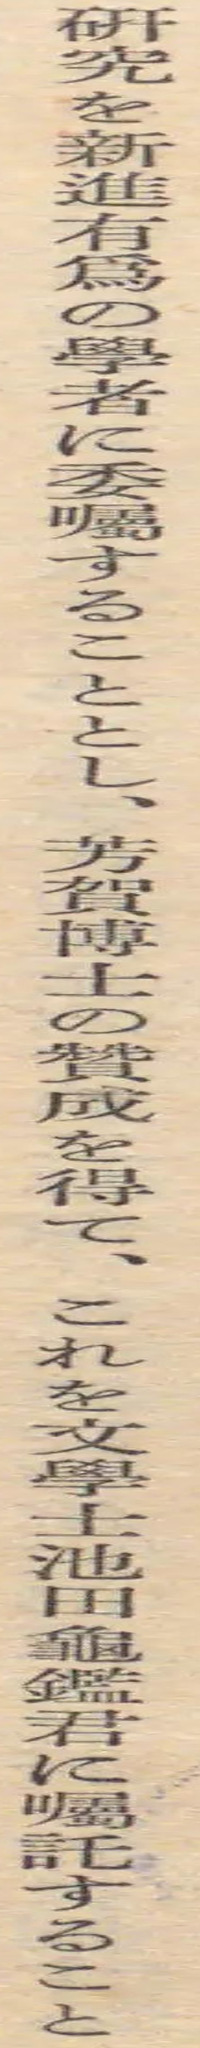硏究を新進有爲の學者に委囑することとし、芳賀博士の贊成を得て、これを文學士池田龜鑑君に囑託すること
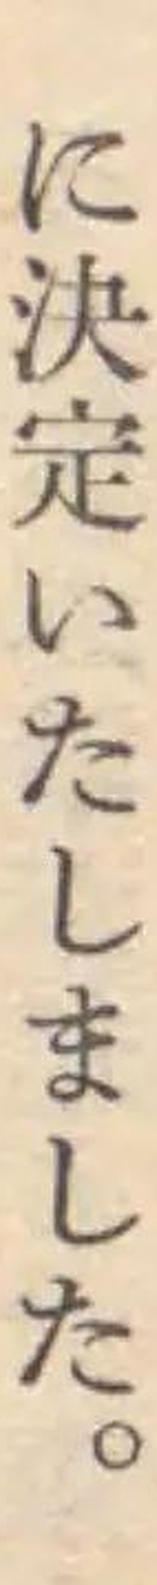に決定いたしました。
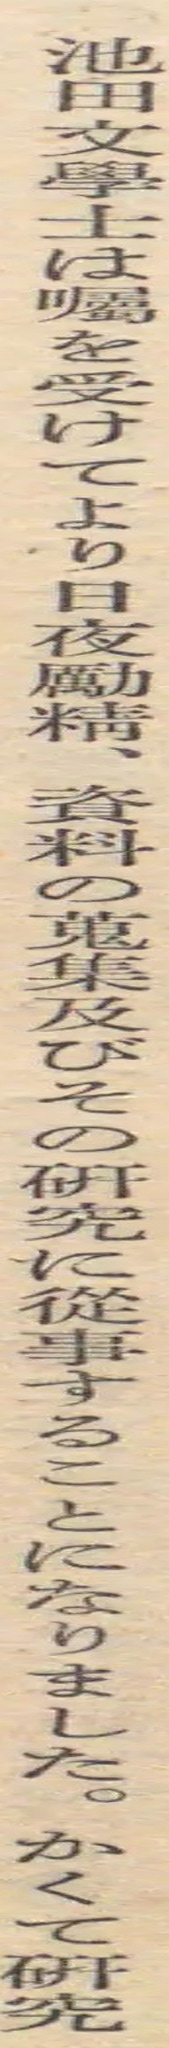池田文學士は囑を受けており日夜勵精、資料の蒐集及びその硏究に從事することになりました、かくて硏究
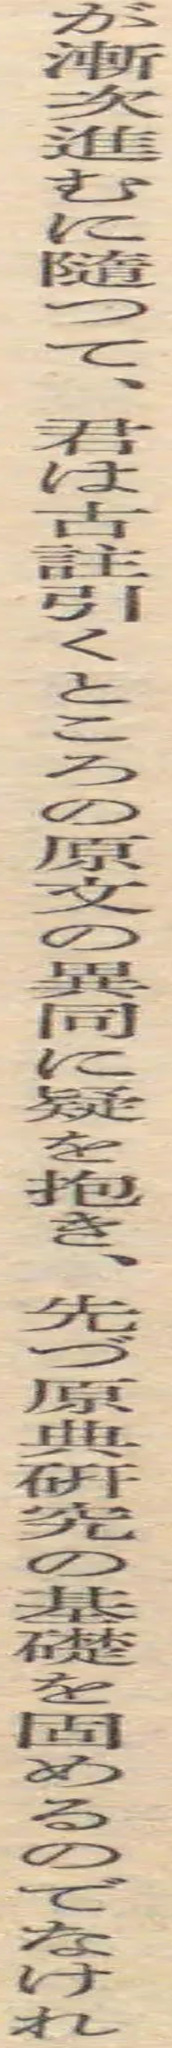が漸次進むに隨つて、君は古註引くところの原文の異同に疑を抱き、先づ原典硏究の基礎を固めるのでなけれ
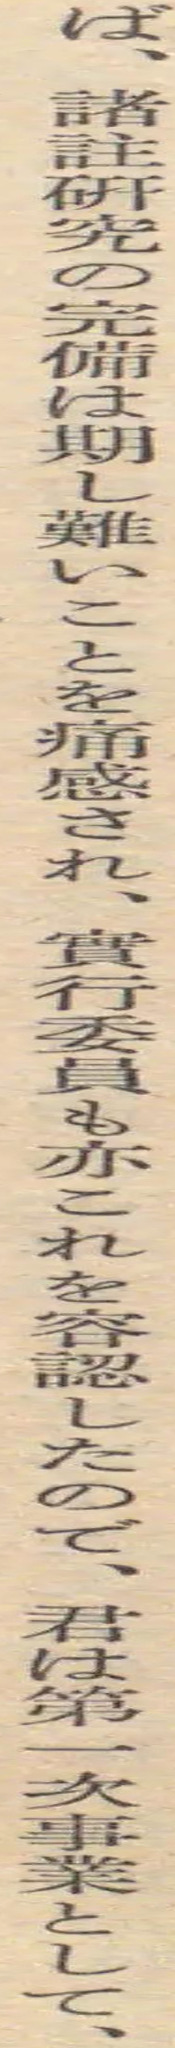ば、諸註硏究の完備は期し難いことを痛感され、實行委員も亦これを容認したので、君は第一次事業として、
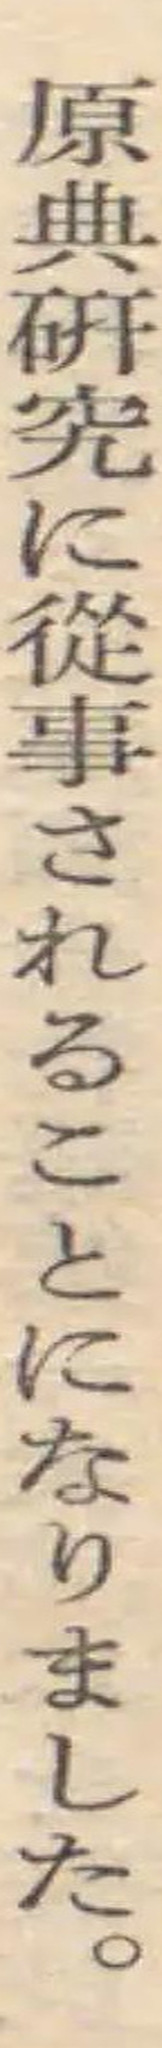原典硏究に從事されることになりました。
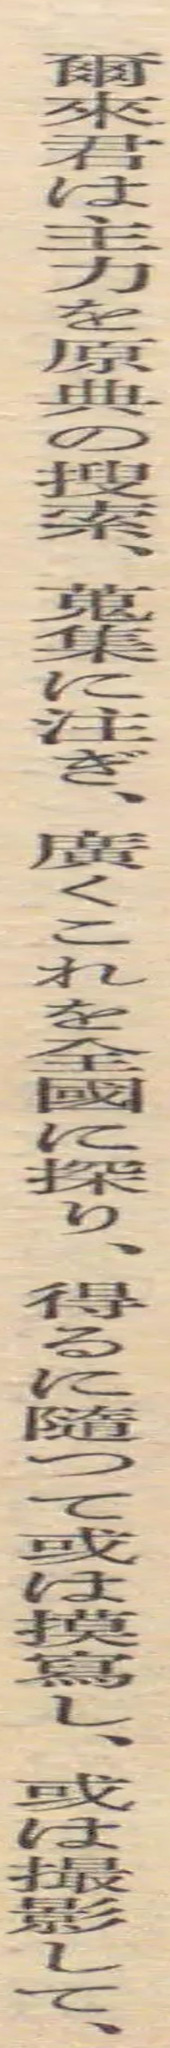爾來君は主力を原典の捜索、蒐集に注ぎ、廣くこれを全國に探り、得るに隨つて或は摸寫し、或は撮影して、
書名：校異源氏物語.
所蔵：国立国会図書館 National Diet Library, JAPAN
